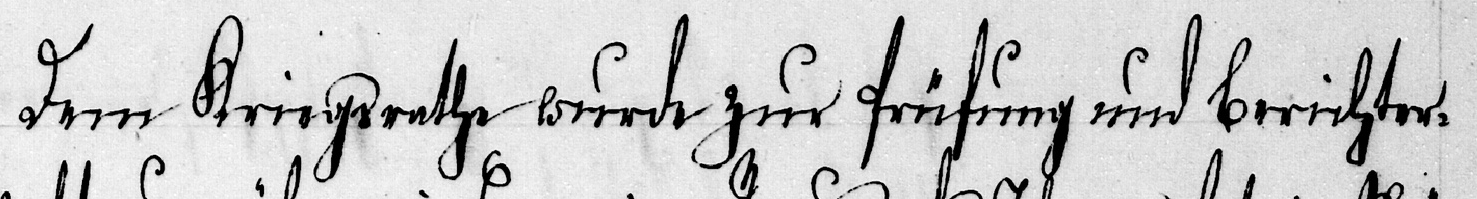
Dem Kriegsrathe wurde zur Prüfung und Berichter¬
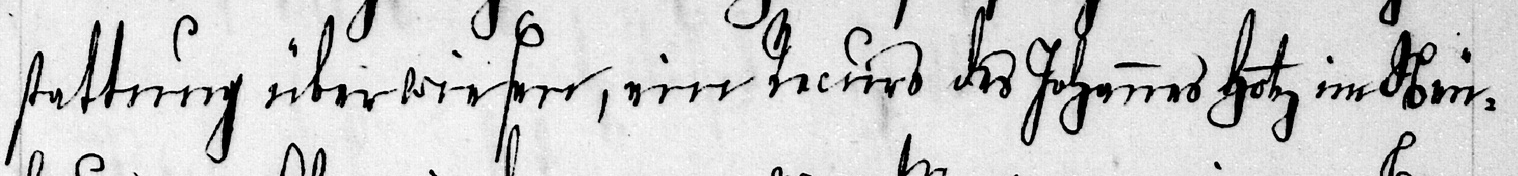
stattung überwiesen, ein Recurs des Johannes Hotz im Neu¬
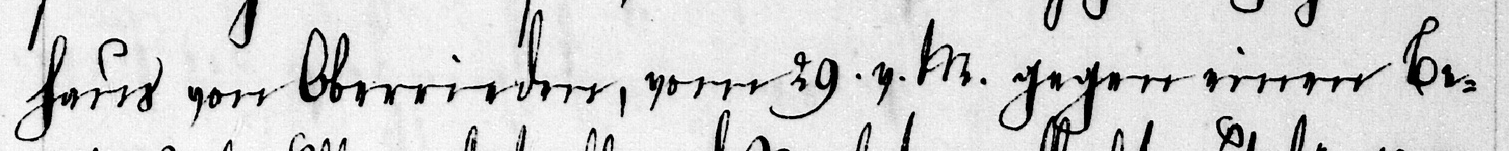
haus von Oberrieden, vom 29. v. M. gegen einen Bes¬
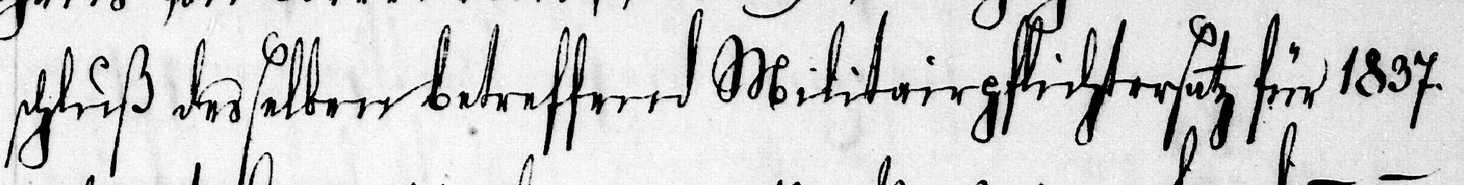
chluß desselben betreffend Militairpflichtersatz für 1837.
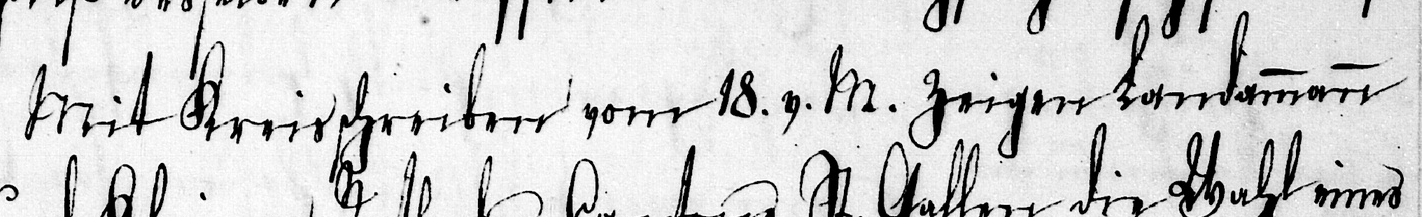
Mit Kreisschreiben vom 18. v. M. zeigen Landammann
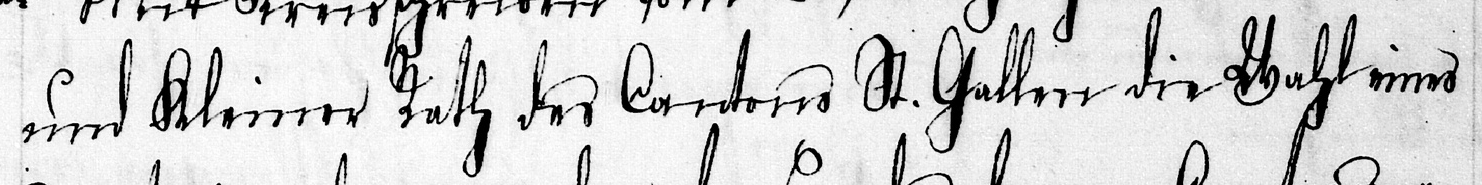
und kleiner Rath des Cantons St. Gallen die Wahl eines
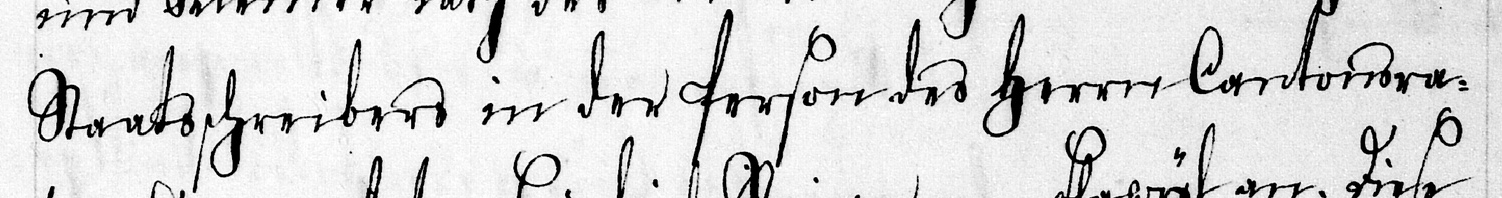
Staatsschreibers in der Person des Herrn Cantonsra¬
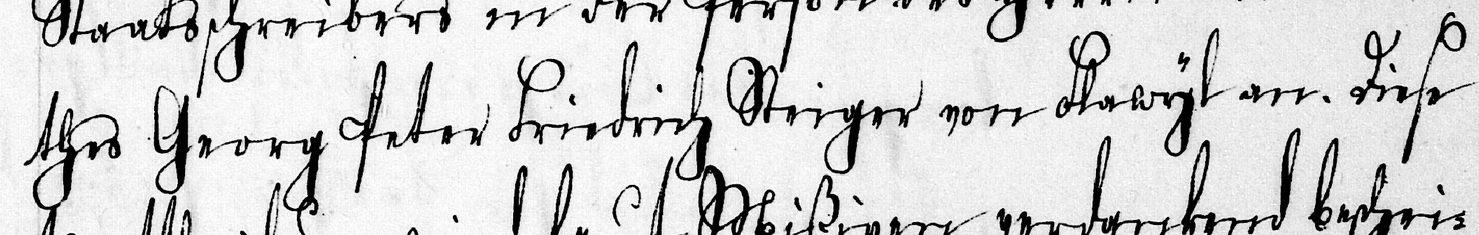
thes Georg Peter Friedrich Steiger von Flawyl an. Diese
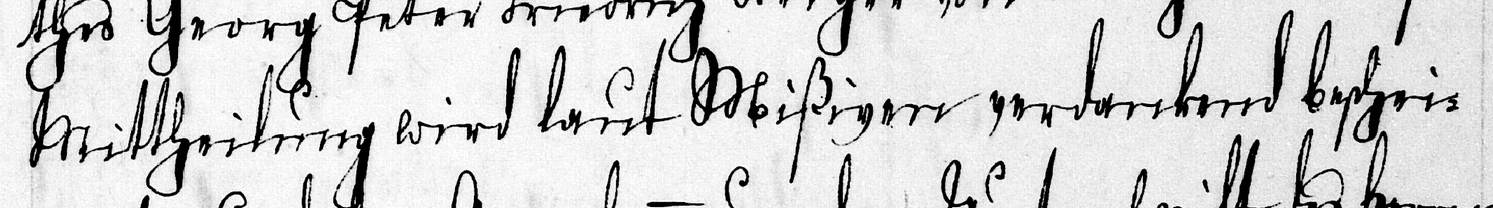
Mittheilung wird laut Mißiven verdankend beschei¬
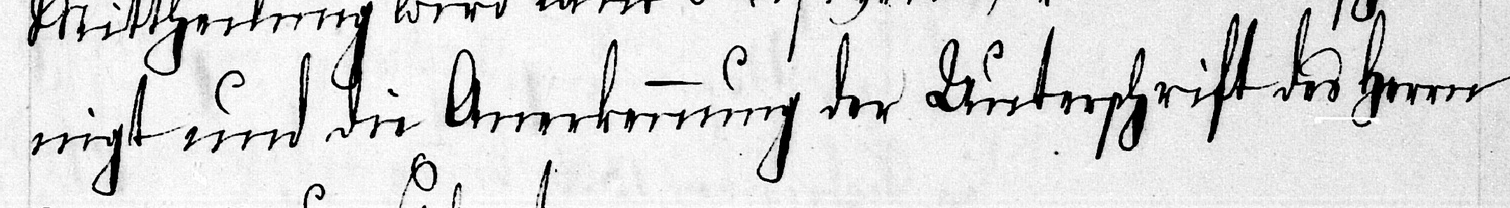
nigt und die Anerkennung der Unterschrift des Herrn
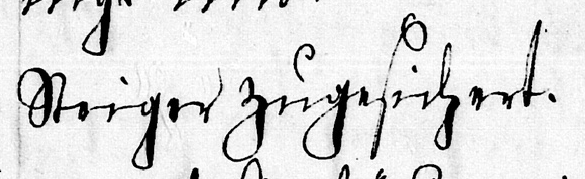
Steiger zugesichert.
